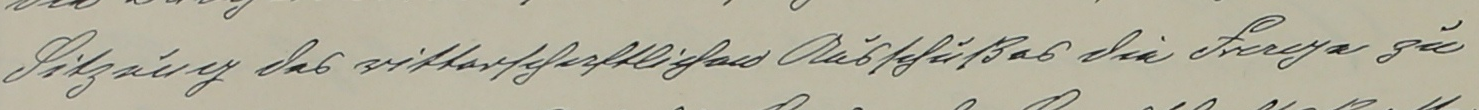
Sitzung des ritterschaftlichen Ausschußes die Frage zu
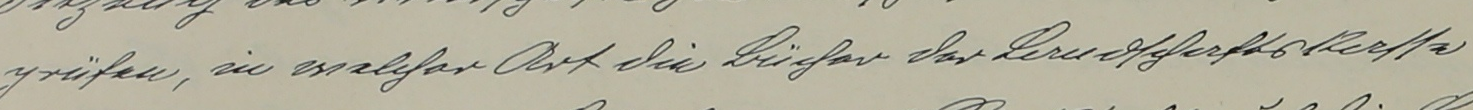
prüfen, in welcher Art die Bücher der Landschaftskasse
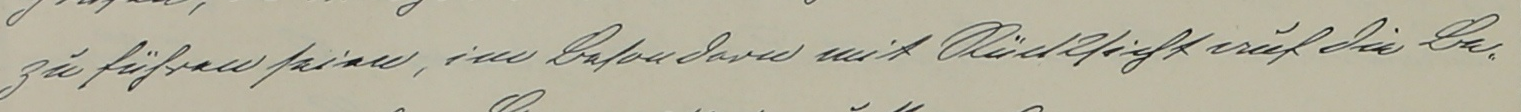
zu führen seien, im Besondern mit Rücksicht auf die Be-
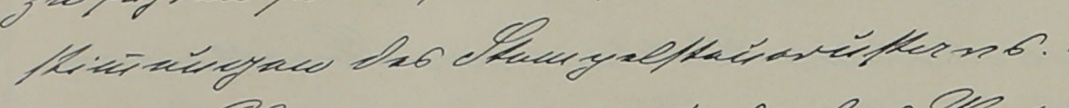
stimmungen des Stempelsteuerustavs.
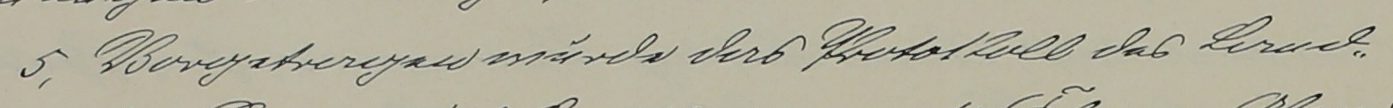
5. Vorgetragen wurde das Protokoll des Land-
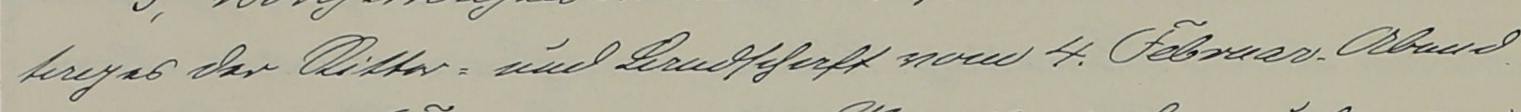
tages der Ritter- und Landschaft vom 4. Februar-Abend
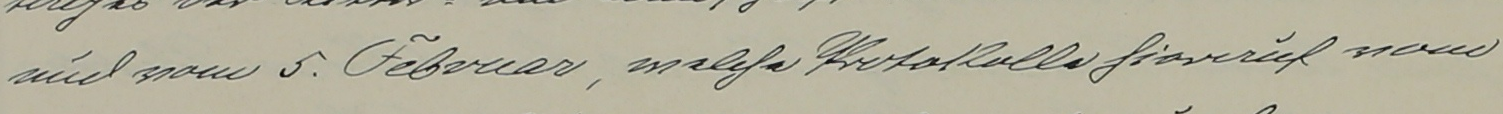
und vom 5. Februar, welche Protokolle hierauf vom
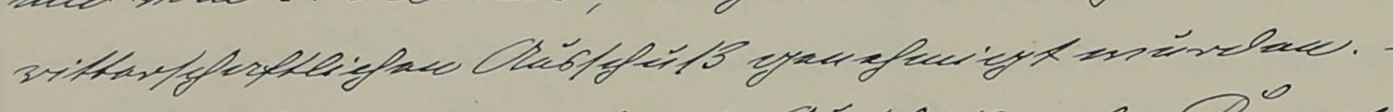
ritterschaftlichen Ausschuß genehmigt wurden.
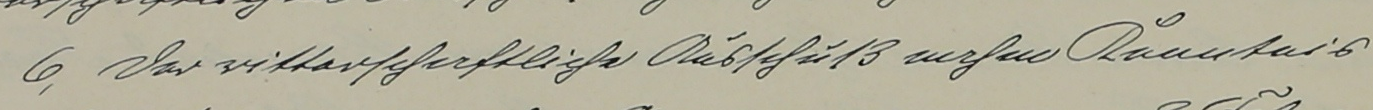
6. Der ritterschaftliche Ausschuß nahm Kenntnis
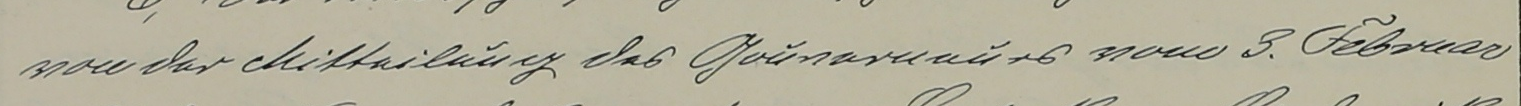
von der Mitteilung des Gouverneurs vom 3. Februar
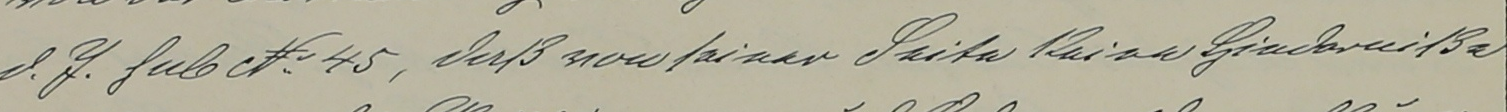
d.J. sub No. 45, daß von seiner Seite keine Hinderniße
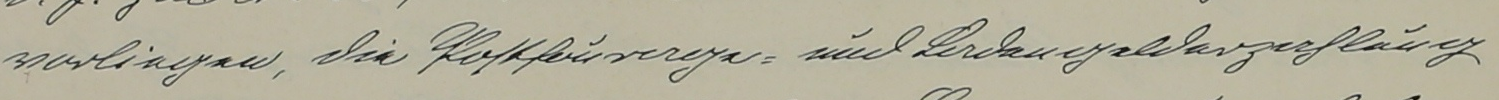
vorliegen, die Postfourage- und Ladengelderzahlung
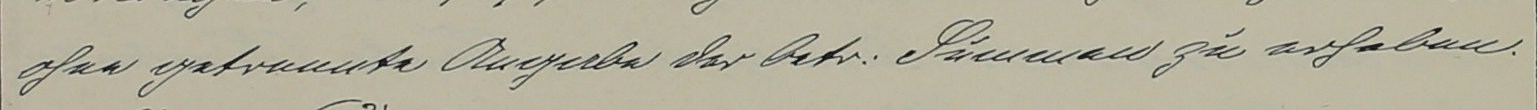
ohne getrennte Angabe der betr. Summen zu erheben.
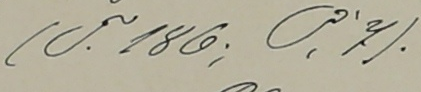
(T.186; P.7).
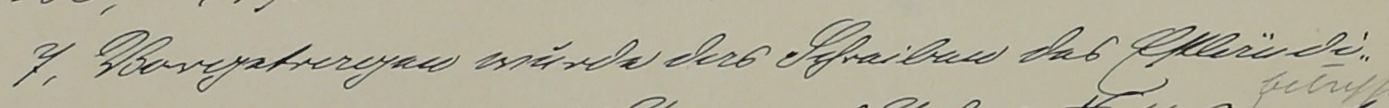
7. Vorgetragen wurde das Schreiben des Estländi-
